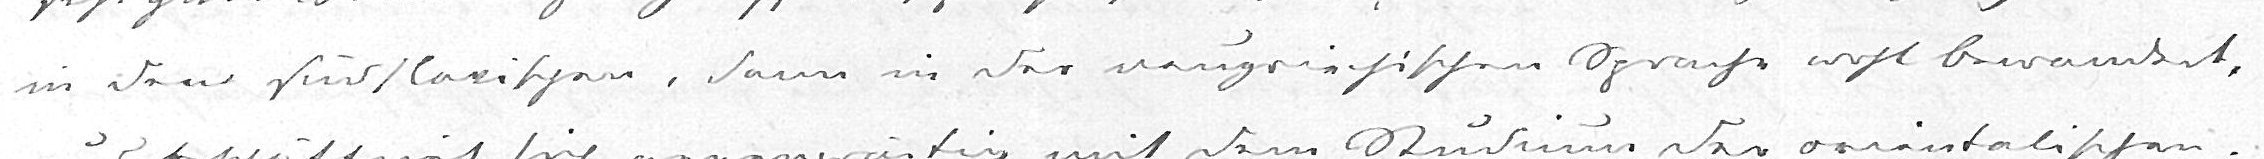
in den südslawischen, sowie in der neugriechischen Sprache wohl bewandert,
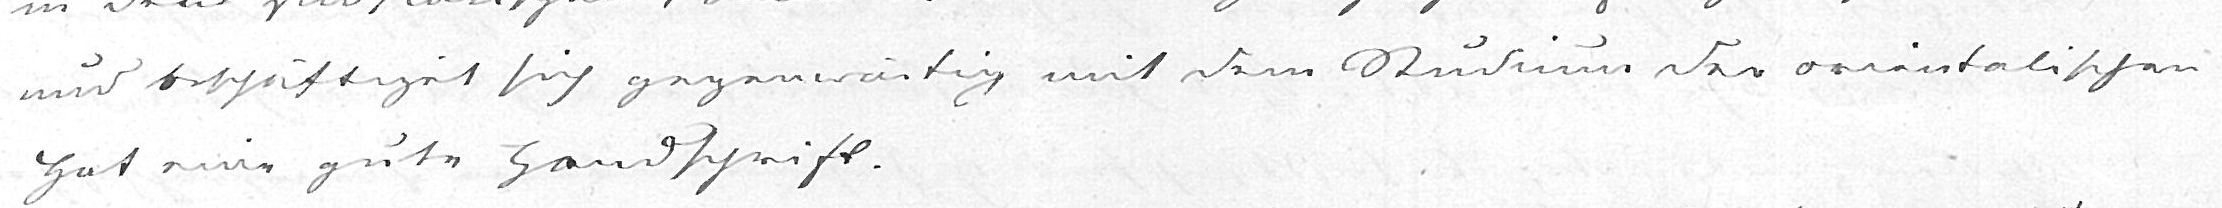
und beschäftiget sich gegenwärtig mit dem Studium der orientalischen.
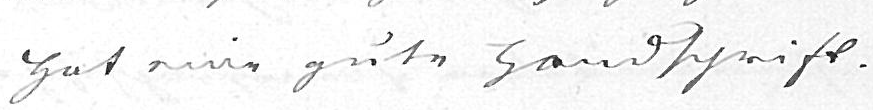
Hat eine gute Handschrift.
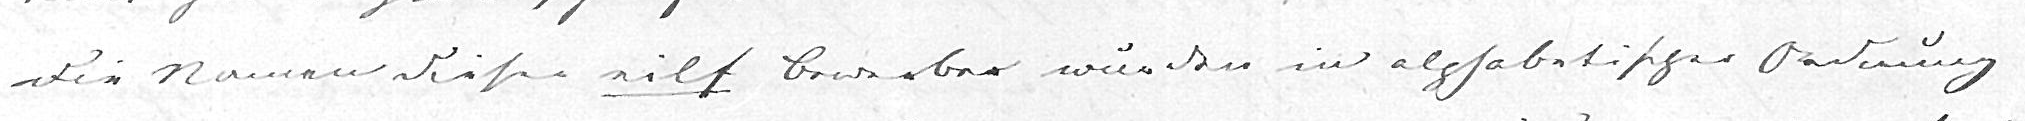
Die Namen dieser eilf Bewerber wurden in alphabetischer Ordnung
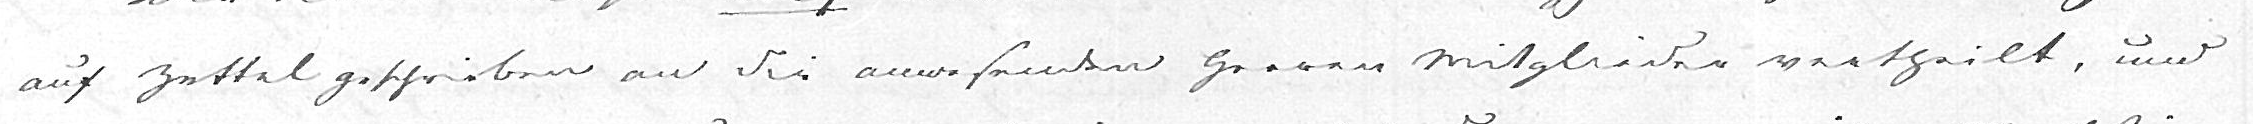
auf Zettel geschrieben an die anwesenden Herren Mitglieder vertheilt, und
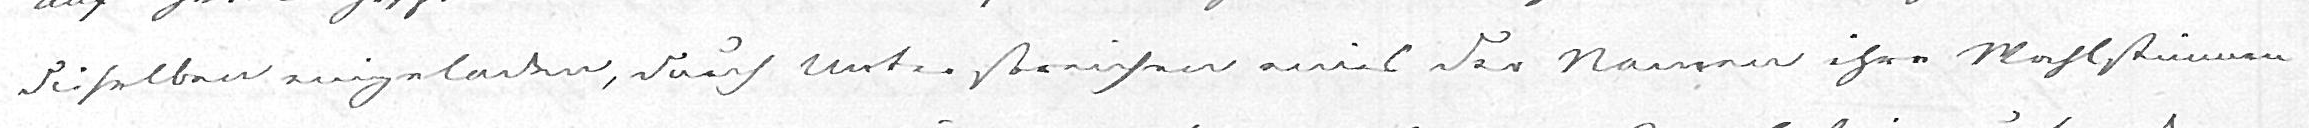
dieselben eingeladen, durch Unterstreichen eines der Namen ihre Wahlstimmen
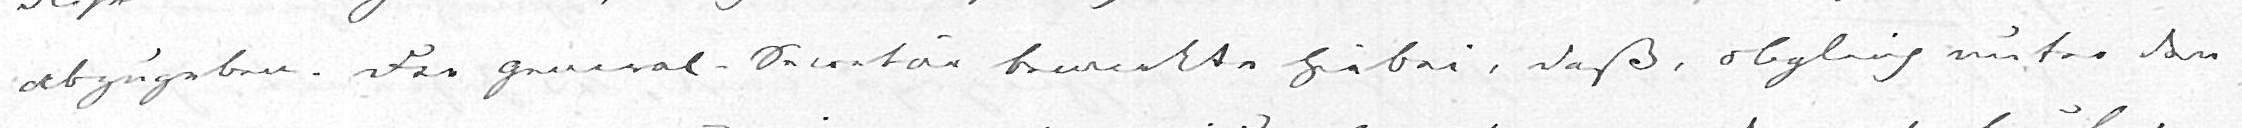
abzugeben. Der General-Secretär bemerkte hiebei, daß, obgleich unter den
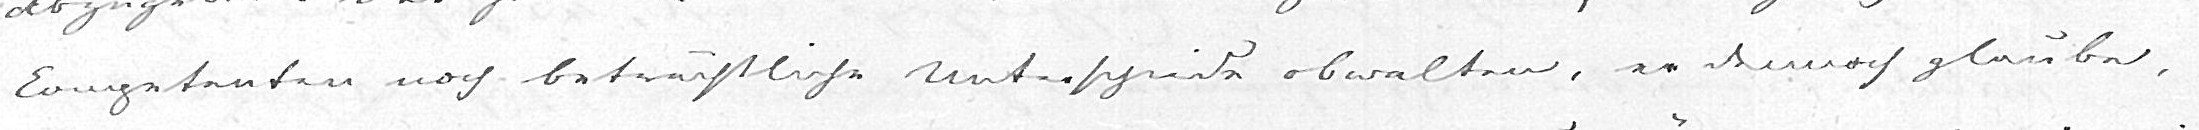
Competenten noch beträchtliche Unterschiede obwalten, er dennoch glaube,
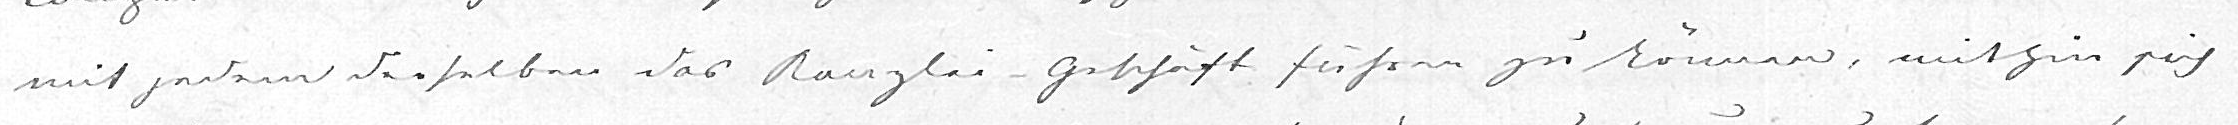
mit jedem derselben das Kanzlei-Geschäft führen zu können, mithin sich
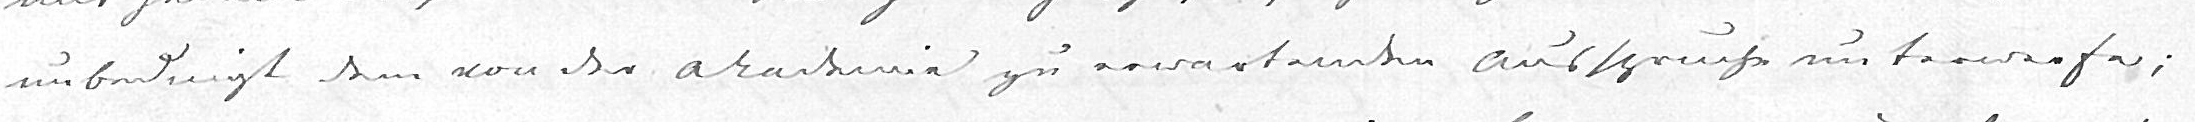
unbedingt, dem von der Akademie zu erwartenden Anspruche unterwerfe;
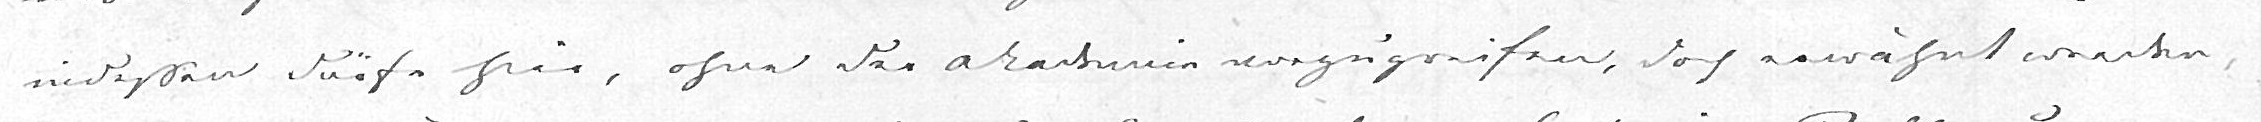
indessen dürfe hier, ohne der Akademie vozugreifen, soch erwähnt werden,
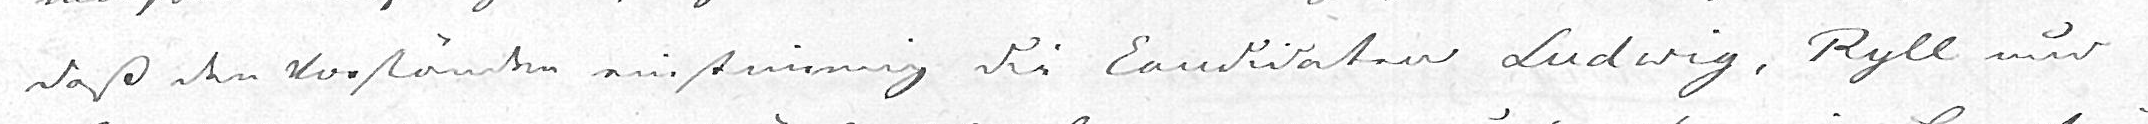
daß die Vorstände einstimmig die Candidaten Ludwig, Ryll und
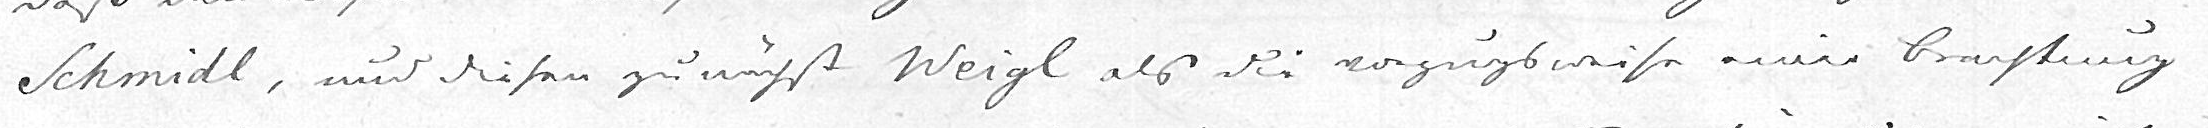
Schmidl, und diesen zunächst Weigl dals die vorzugsweise eine Beachtung
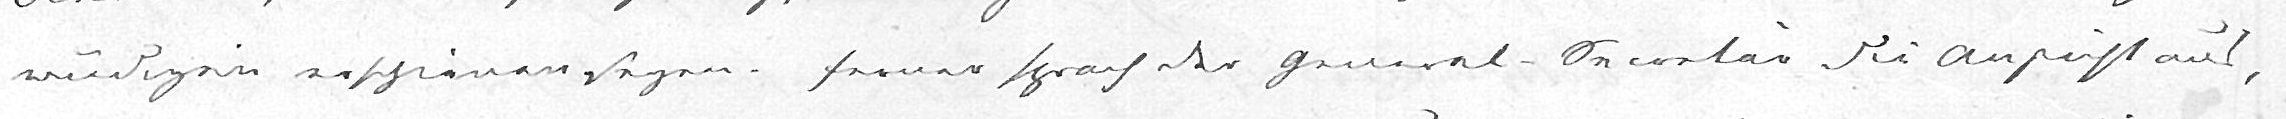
würdigen erschienen seyen. Ferner sprach der General-Secretär die Ansicht aus,
